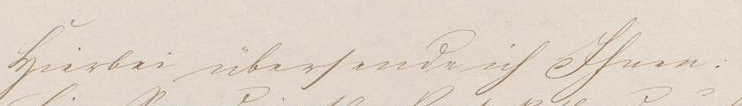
Hierbei übersende ich Ihnen:
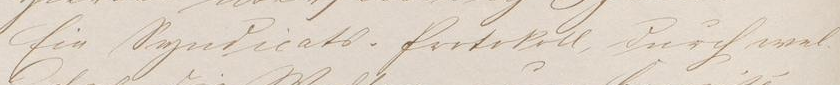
Ein Syndicats-Protokoll, durch wel-
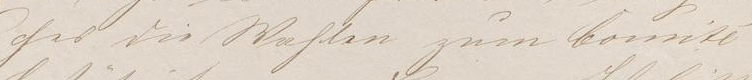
ches die Wahlen zum Comité
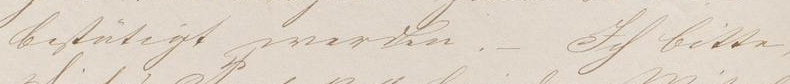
bestätigt werden . – Ich bitte,
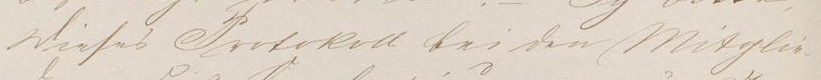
dieses Protokoll bei den Mitglie-
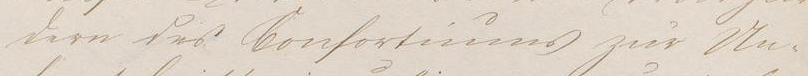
dern des Consortiums zur Un-
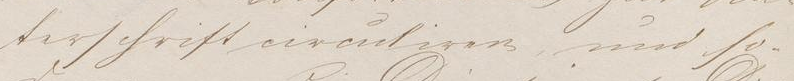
terschrift circuliren, und so-
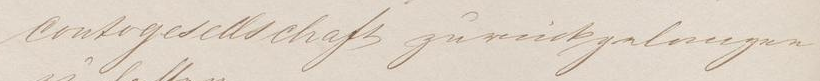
contogesellschaft zurückgelangen
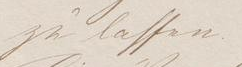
zu lassen.
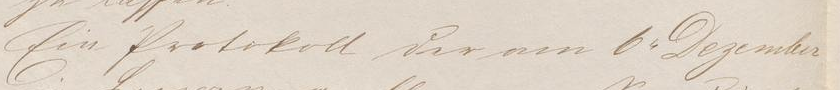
Ein Protokoll der am 6t Dezember
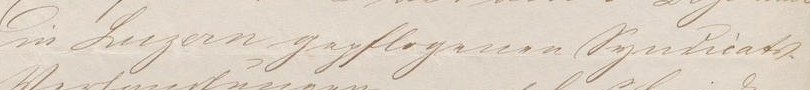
in Luzern gepflogenen Syndicats-
